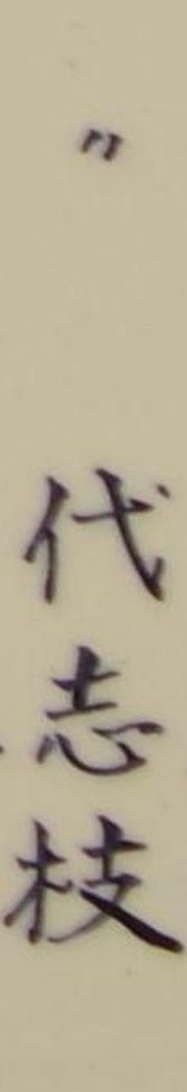代志枝
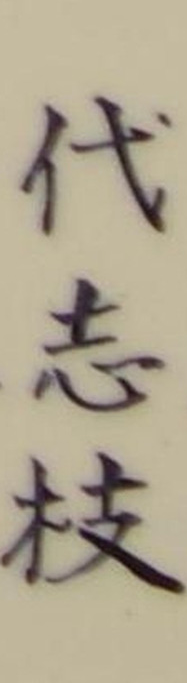代志枝

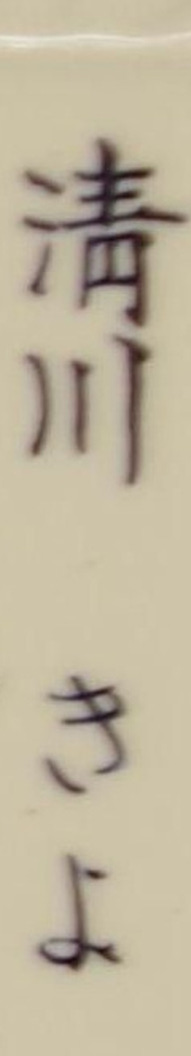清川きよ
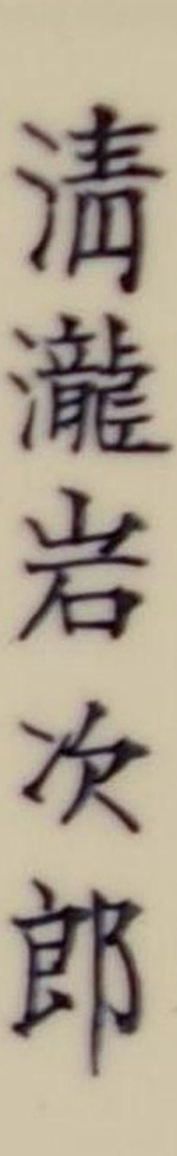清瀧岩次郎
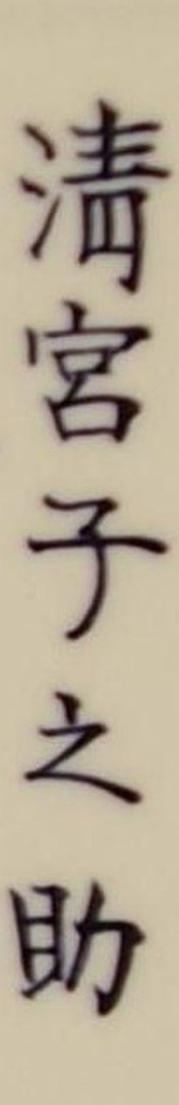清宮子之助
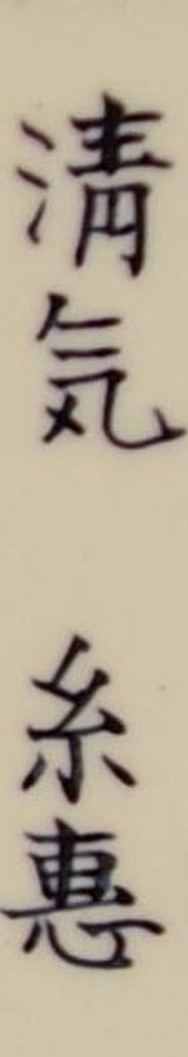清気糸恵
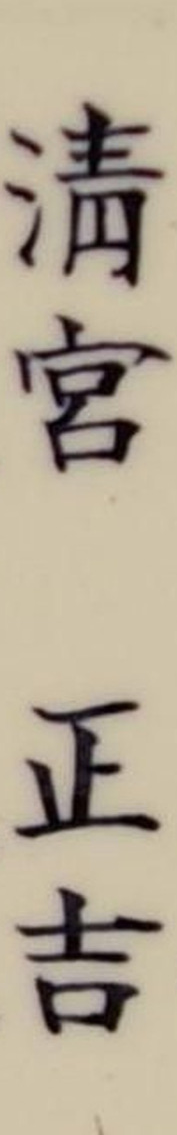清宮正吉
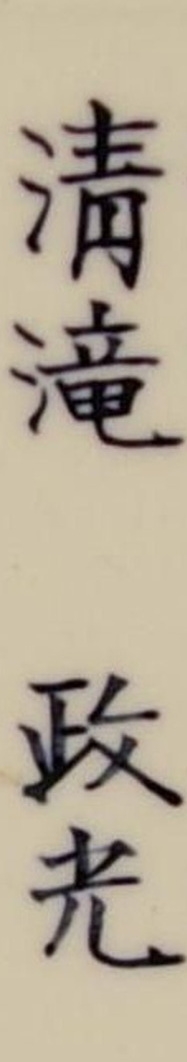清滝政光
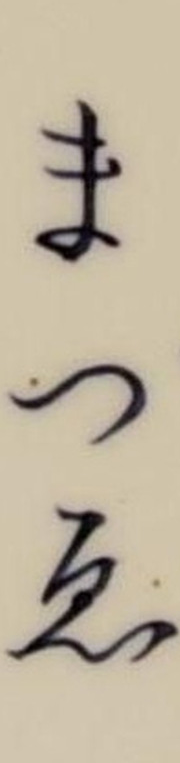まつゑ
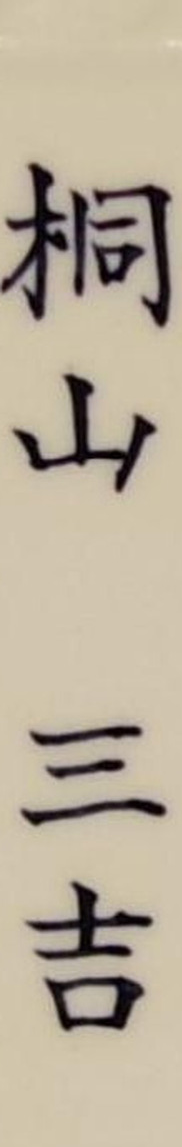桐山三吉
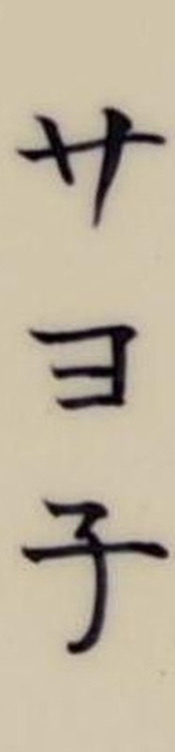サヨ子
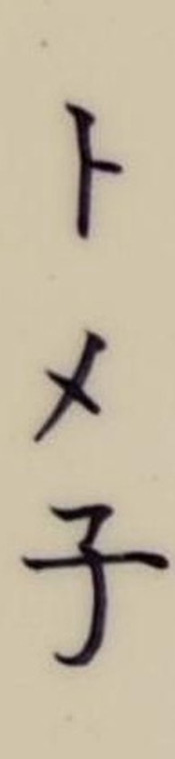トメ子
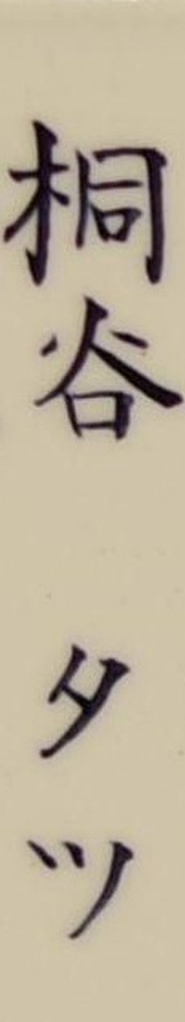桐谷タツ
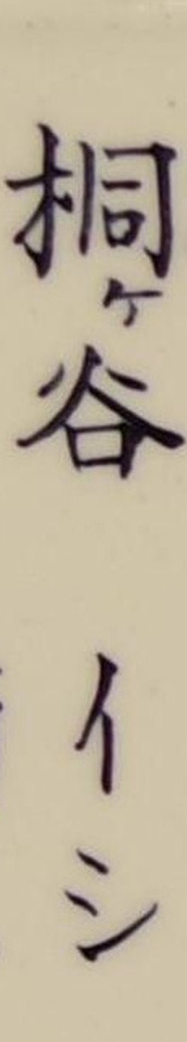桐ヶ谷イシ
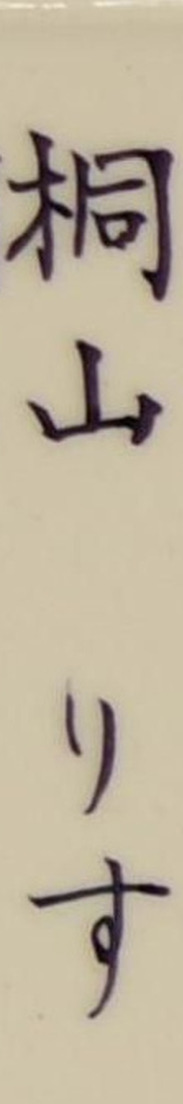桐山りす
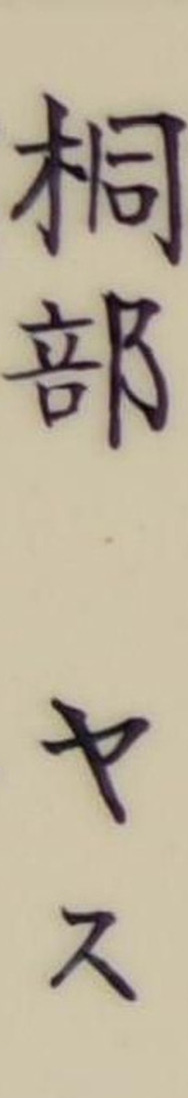桐部ヤス
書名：E~L
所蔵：高野山金剛峯寺
